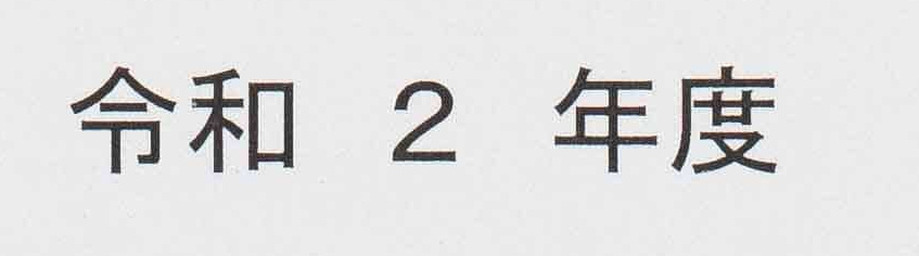令和２年度
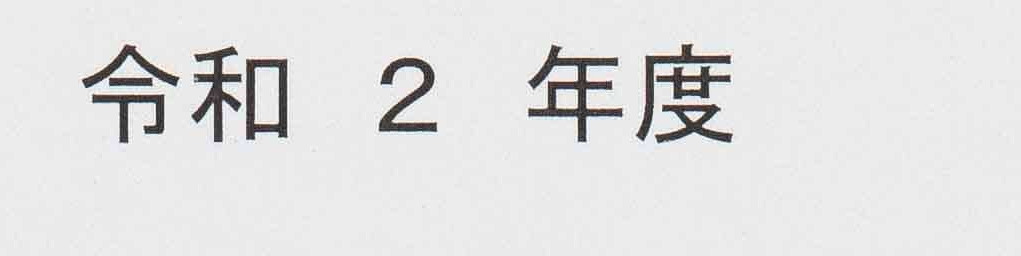令和２年度
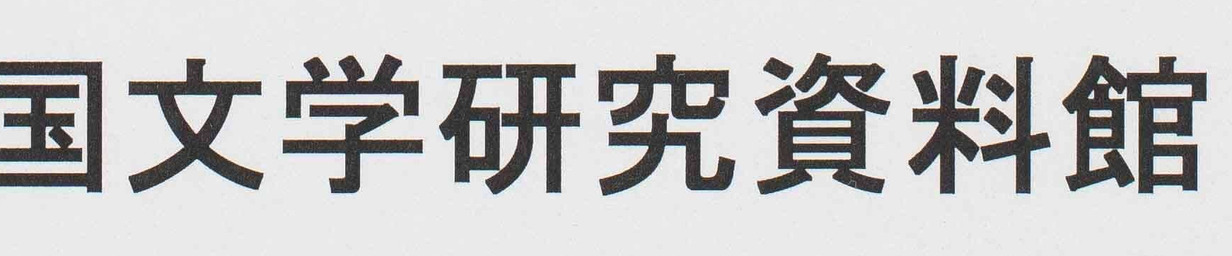国文学研究資料
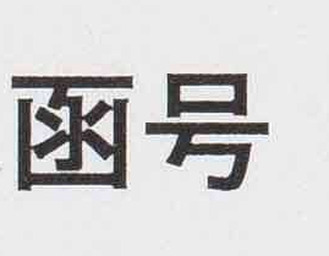函号./
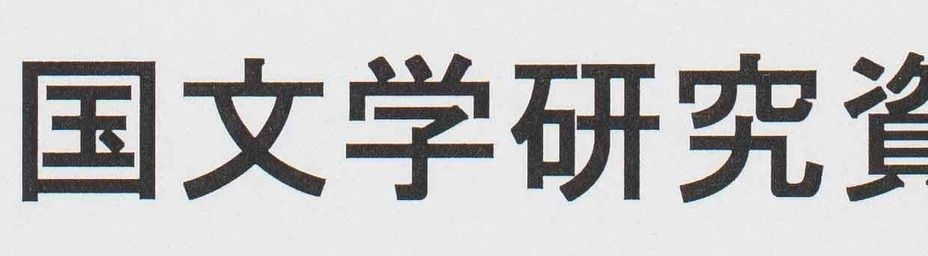国文学研究資料

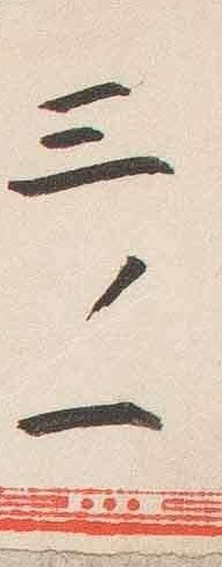三ノ一
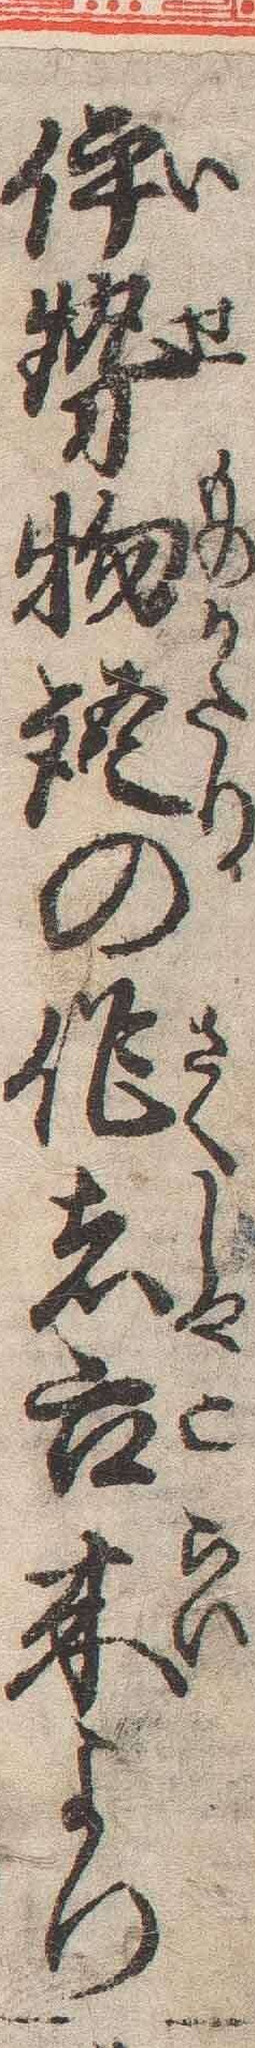伊勢物語の作者古来より
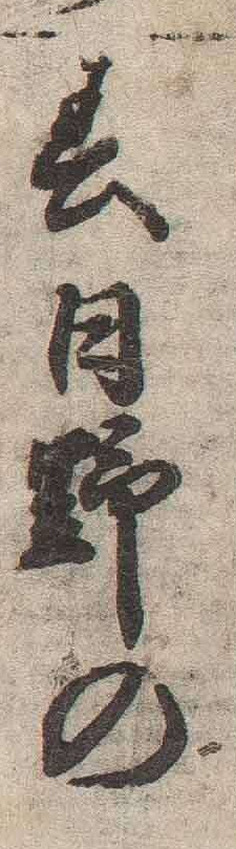春日野の
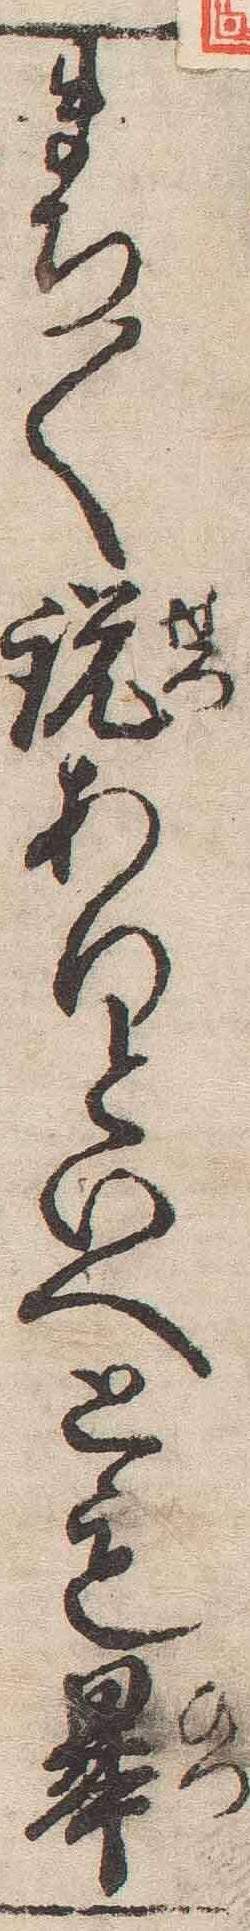まち〳〵説ありといへとも畢
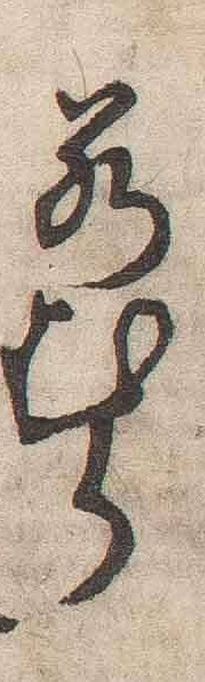若むら
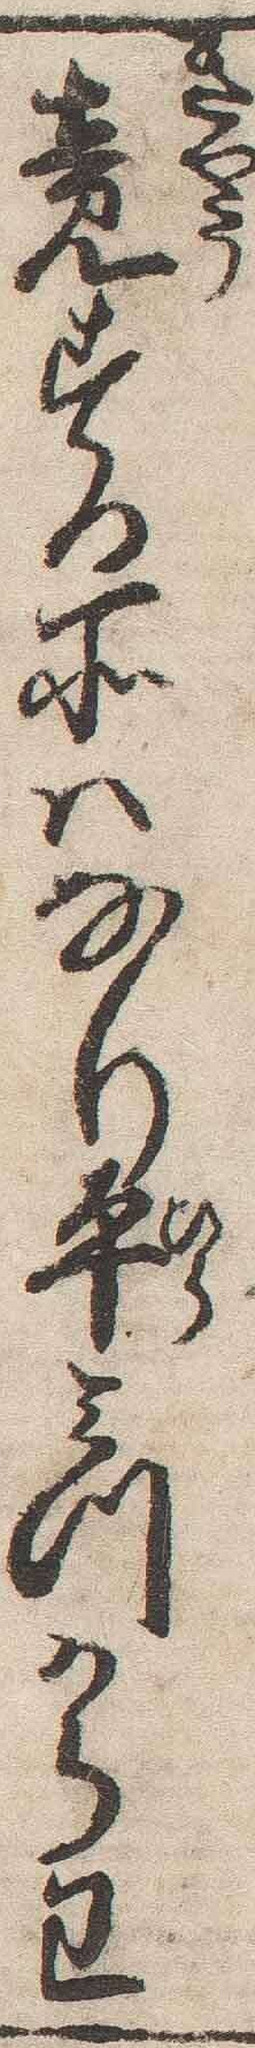竟する所はなり平みつからわ
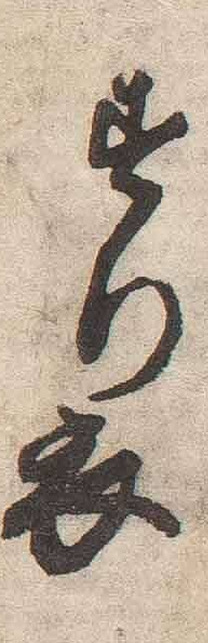すり衣
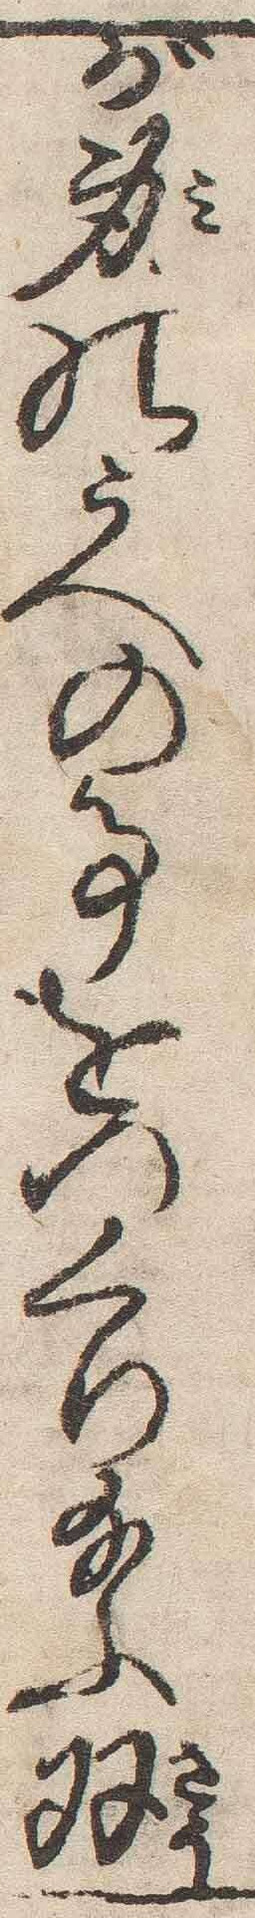が身のうへの事をつくり給ふ双
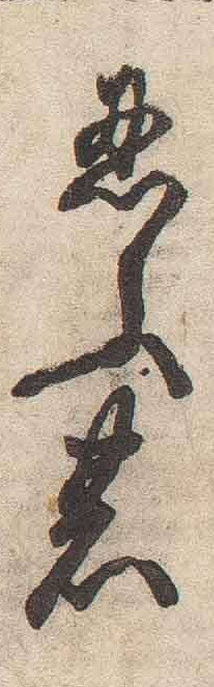忍ふの
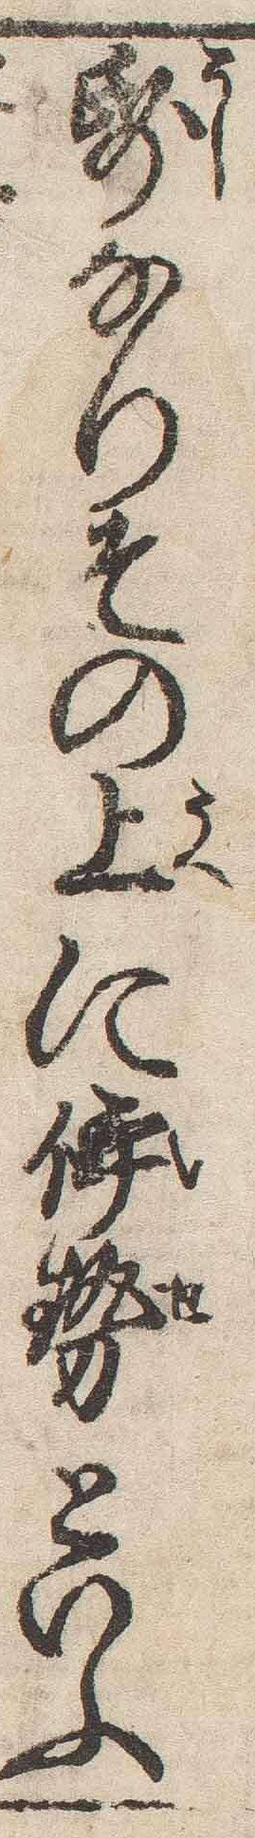紙なりその上に伊勢といふ
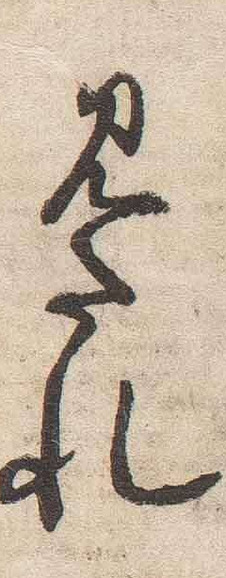みたれ
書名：伊勢物語
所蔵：東京学芸大学附属図書館 国文学研究資料館
